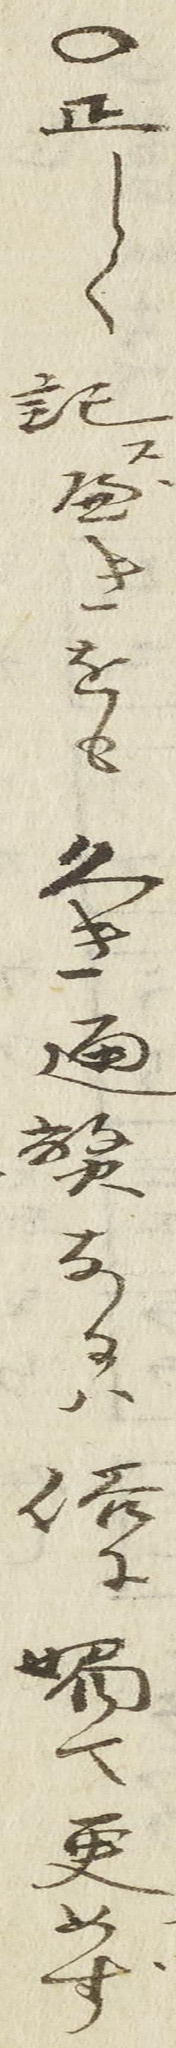○正しく記久き通弊なるは俗に媚て更めず
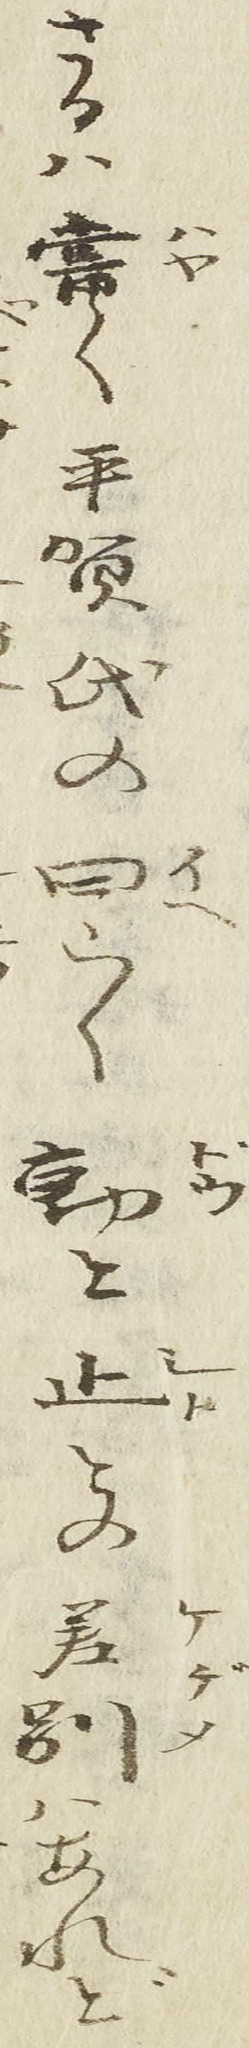さるは嘗〳〵平賀氏の曰らく動と止との差別はあれど
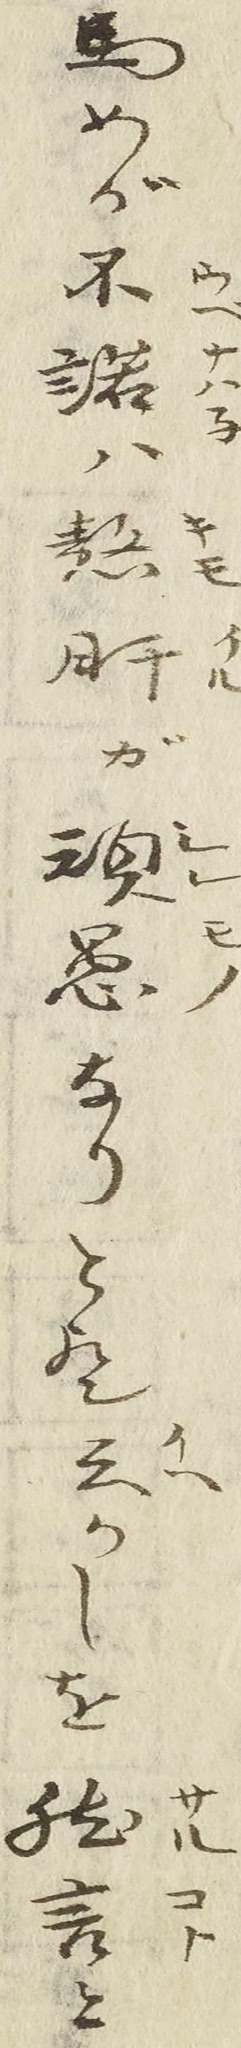馬めが不諾は熬肝が頑愚なりと歟云りしを然言と
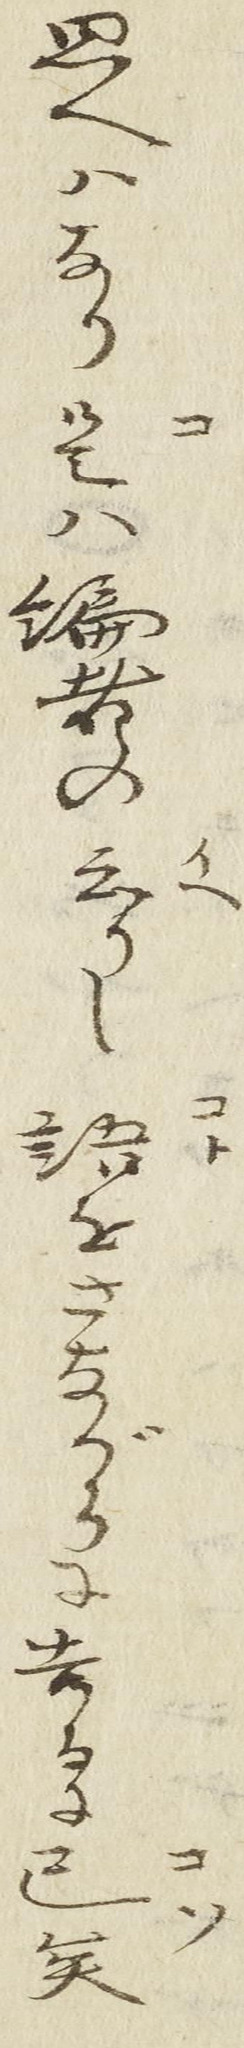思へはなり是は編者の云りし語をさながらに告るに已矣
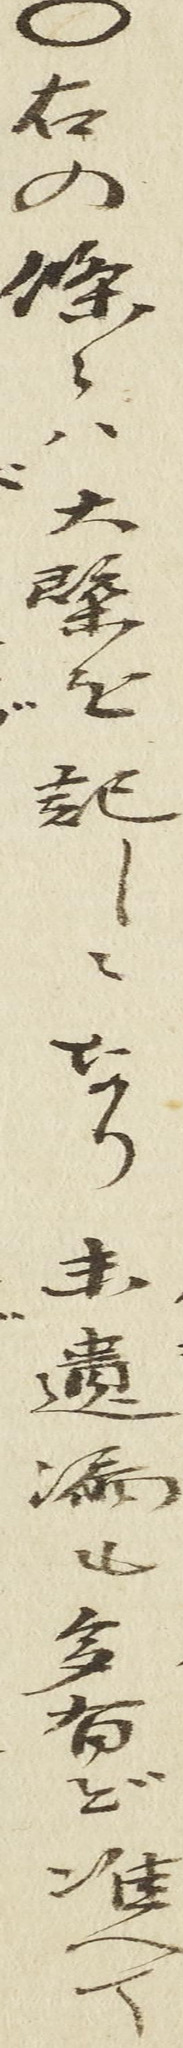○右の条〻は大概を記しになり未遺漏も多有ど准へて
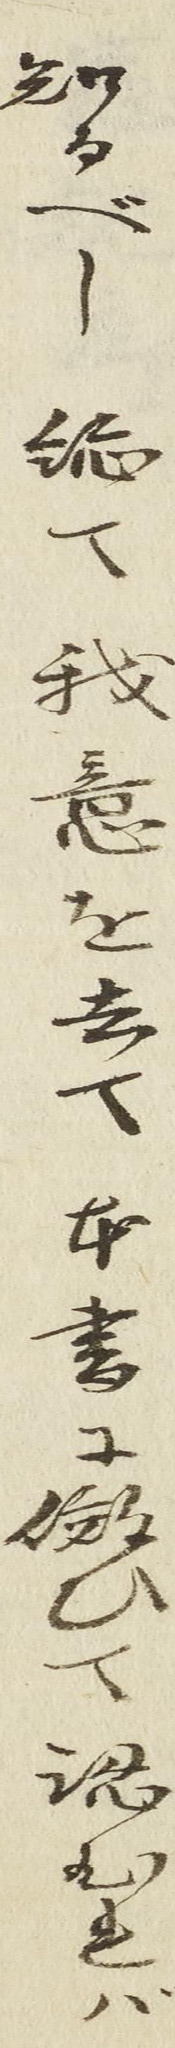知るべし総て我意を去て本書に倣ひて認むれば
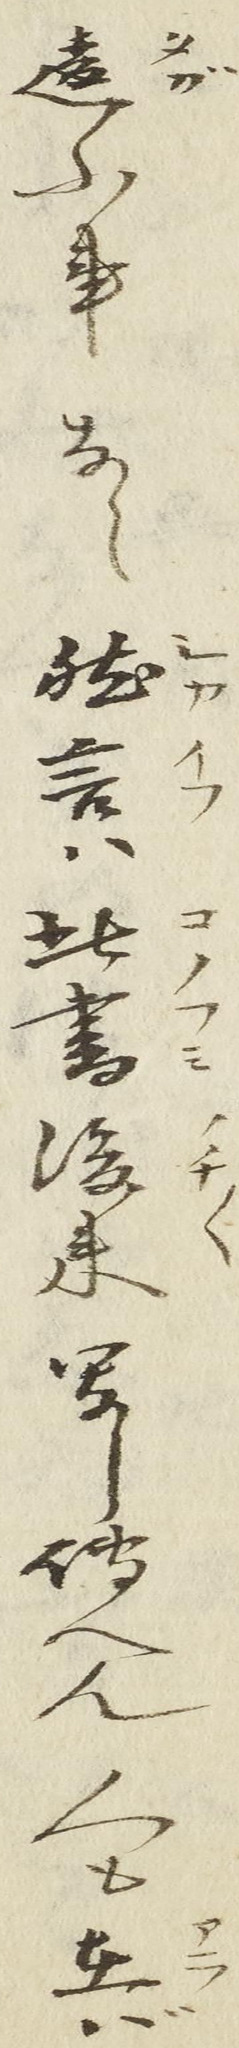違ふ事なし然言は此書後来写し伝へん人も在ば
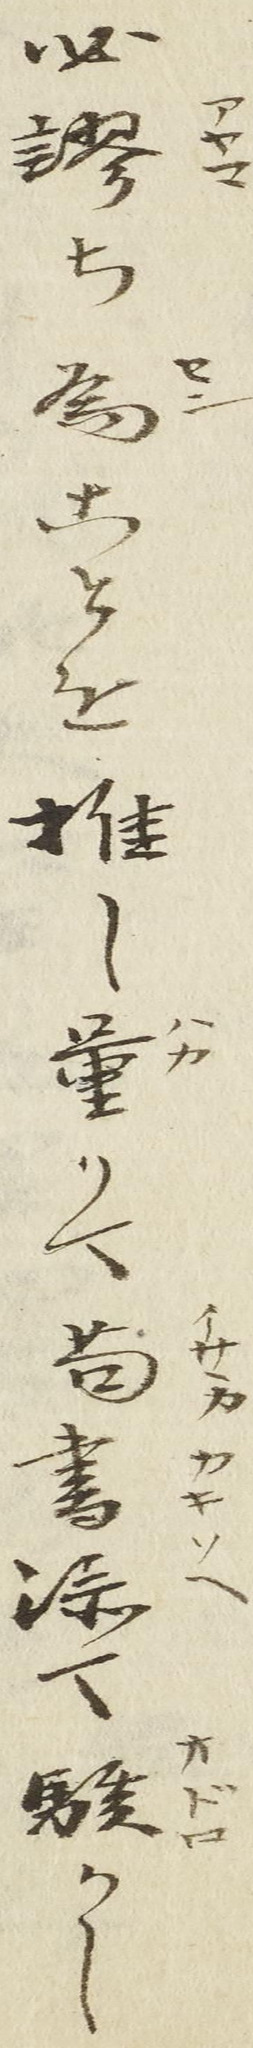必謬ち為ことを推し量りて苟書添て駭かし
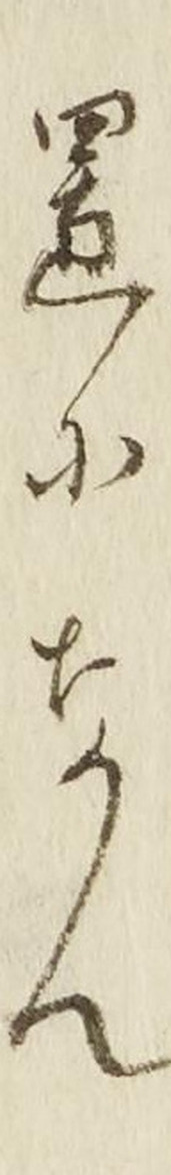置になん

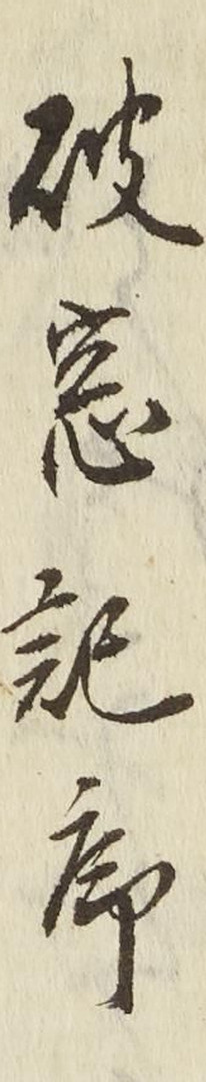破窓記序

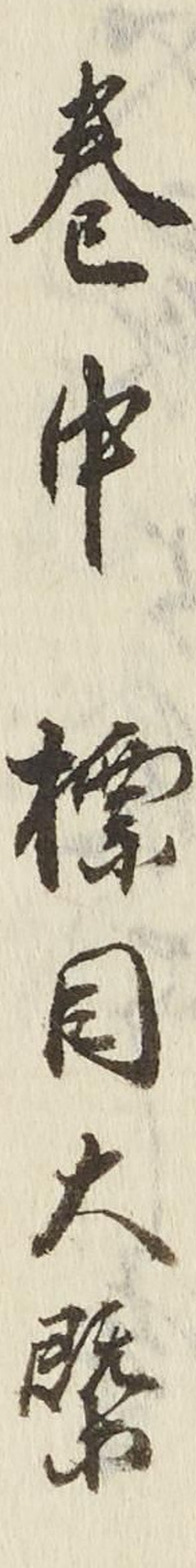巻中標目大概
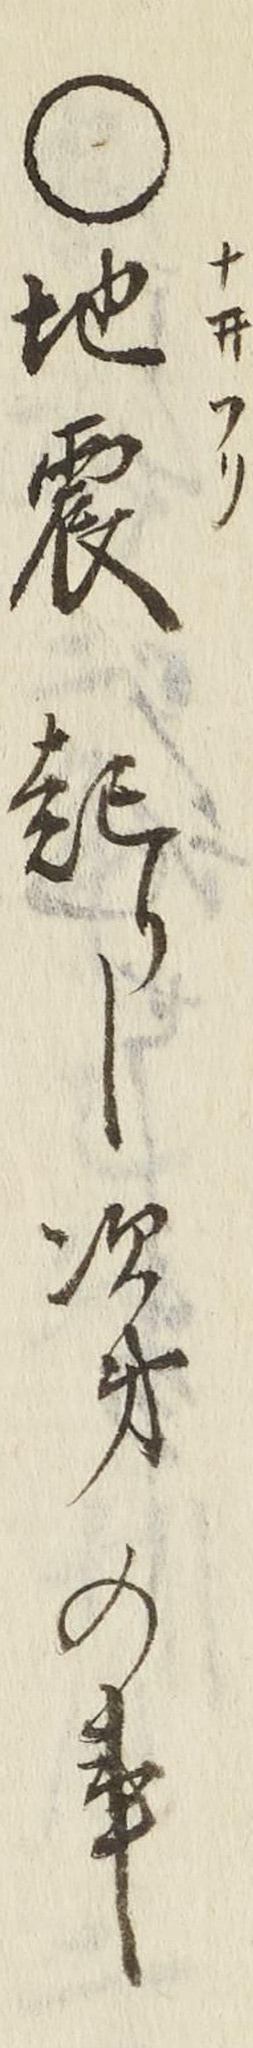〇地震起りし次第の事
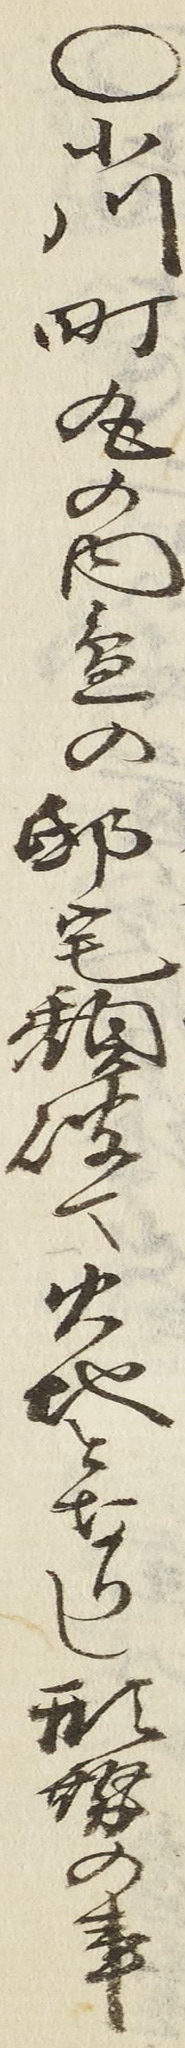〇小川町丸の内辺の邸宅頽破て火地となりし形勢の事
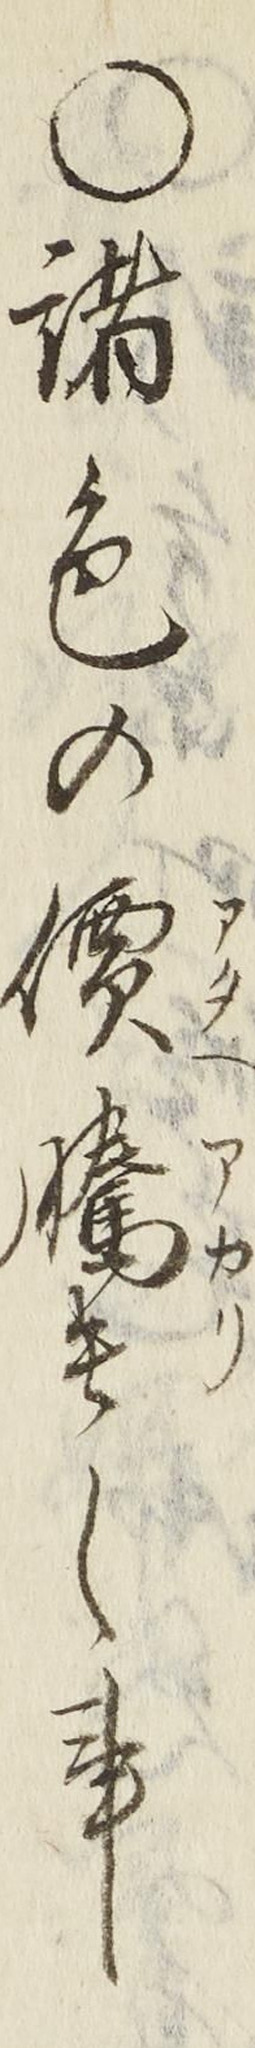〇諸色の価騰貴し事
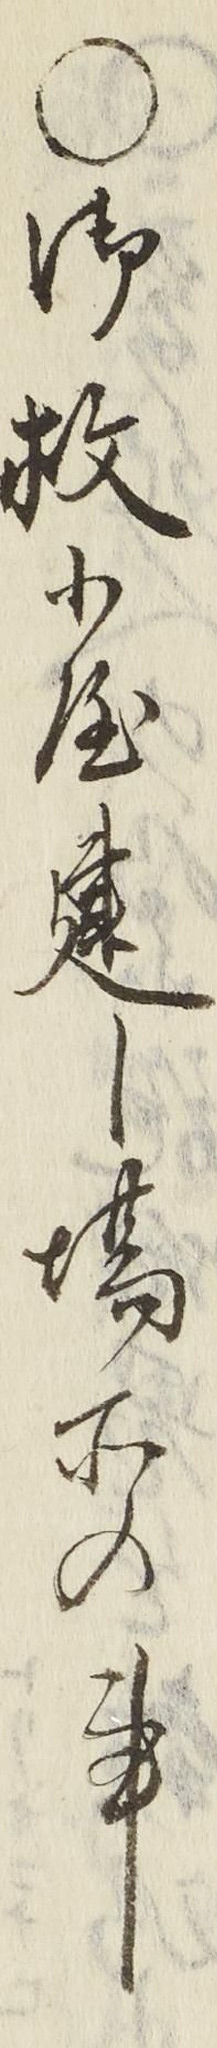〇御救小屋建し場所の事
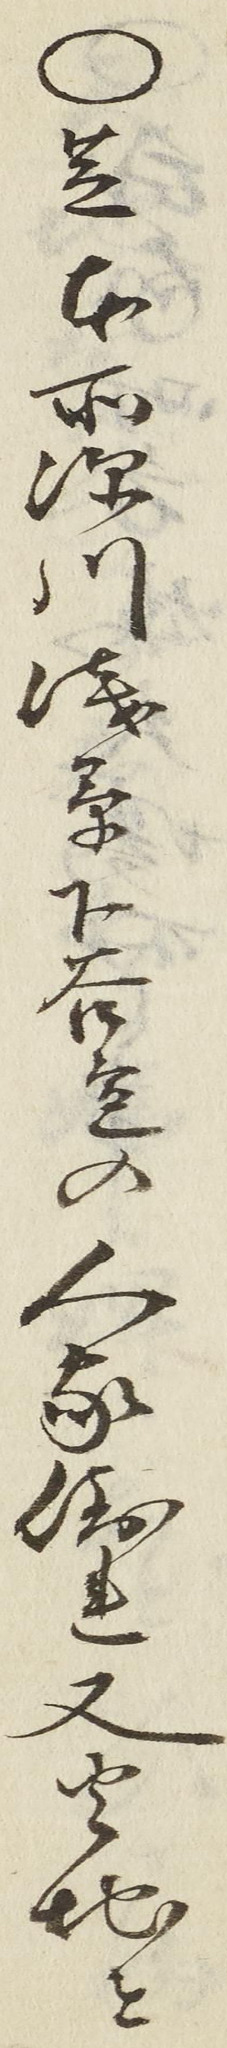〇芝本所深川浅草下谷辺の人家倒れ又火地と
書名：やぶれ窓の記　全
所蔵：東京大学地震研究所図書室 Earthquake Research Institute Library, The University of Tokyo, JAPAN
